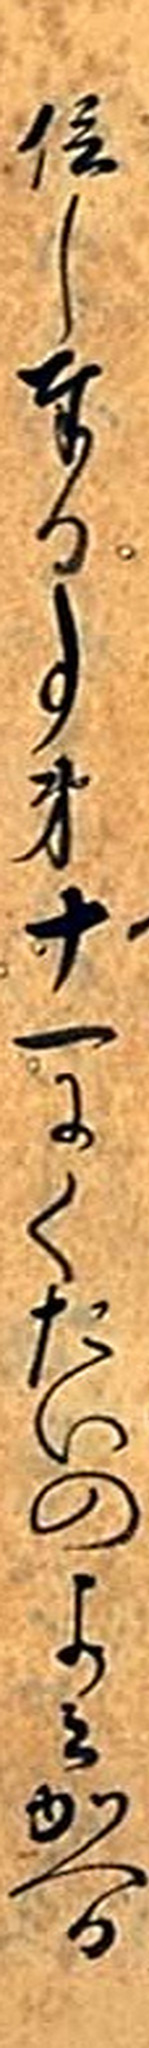信し奉る事第十一にくたいのよみかへる
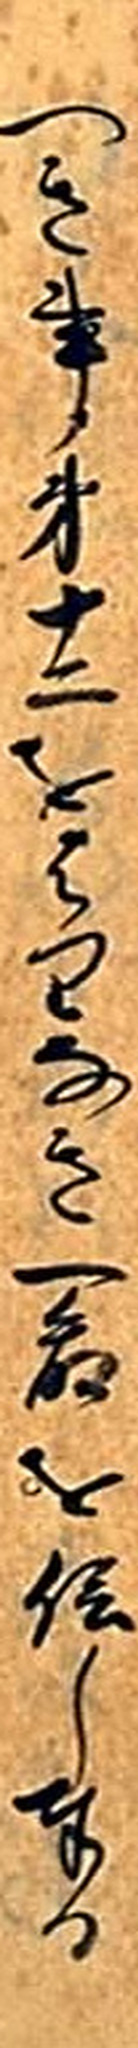へき事第十二をはりなき一命を信し奉る
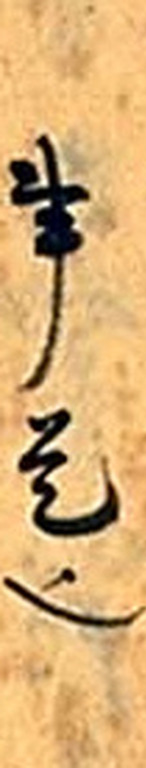事是也
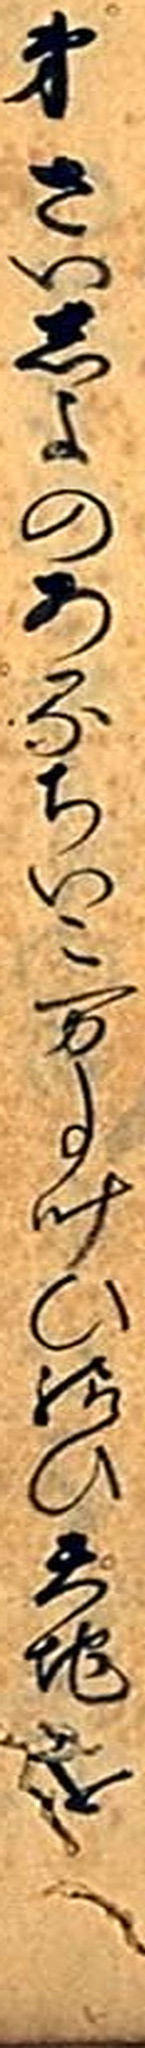弟さいしよのあるちいこ万事叶ひ給ひ天地を
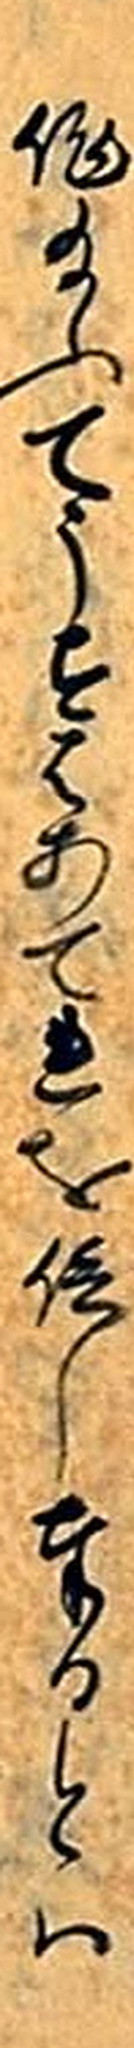作給ふてうすはあてれを信し奉るとは
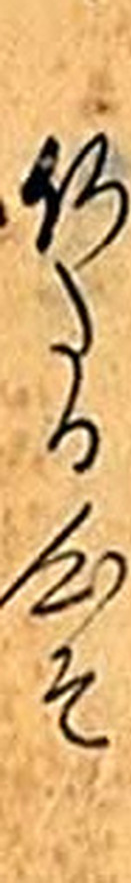何たる心そ
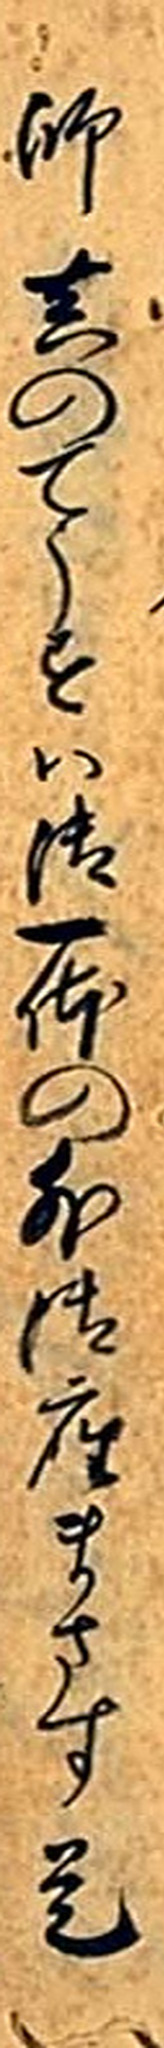師真のてうすは御一体の外御座まさす是
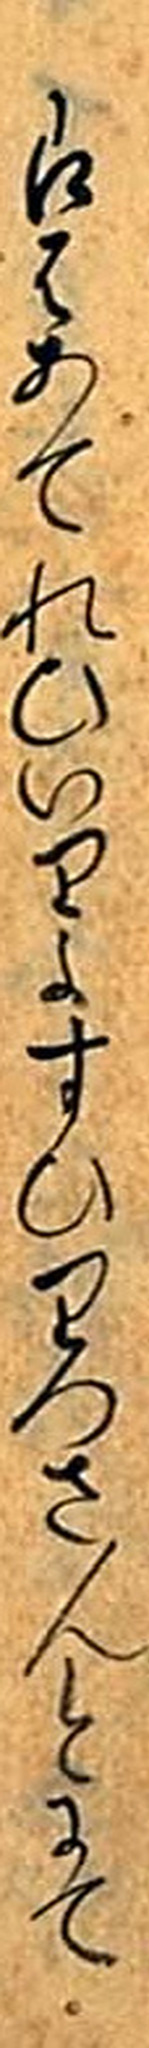即はあてれひいりよすひりつさんとにて
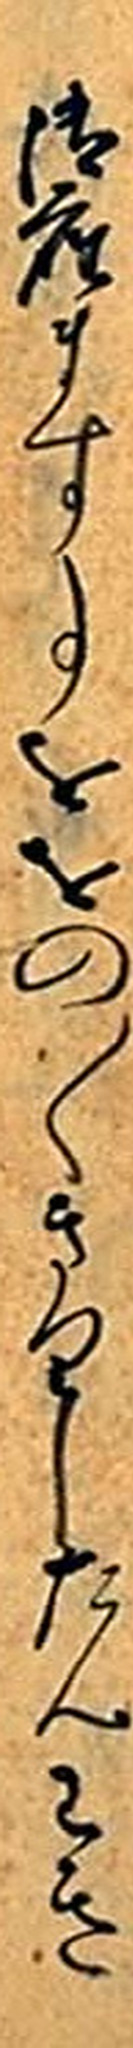御座ます事ををの〳〵きりしたんわき
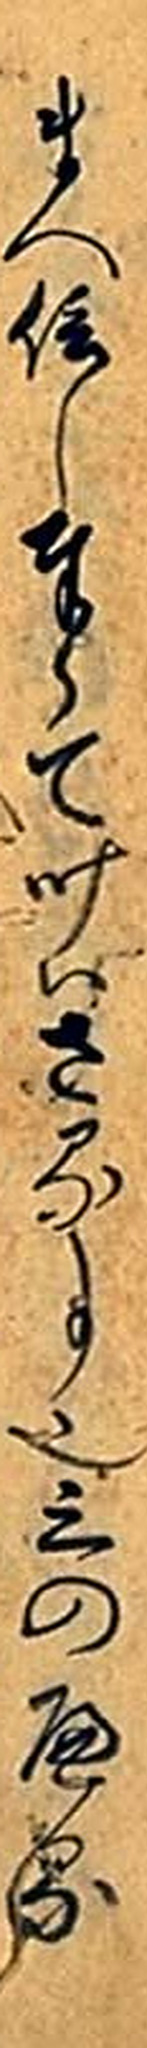まへ信し奉らて叶はさる事也三のへる
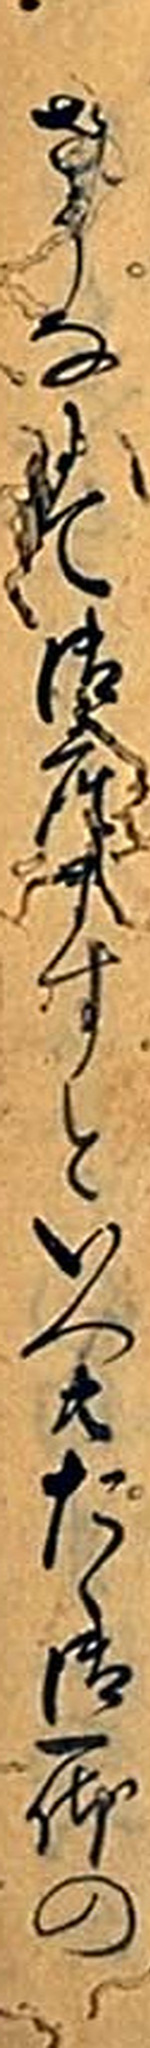さうなにて御座ますといへ共たゝ御一体の

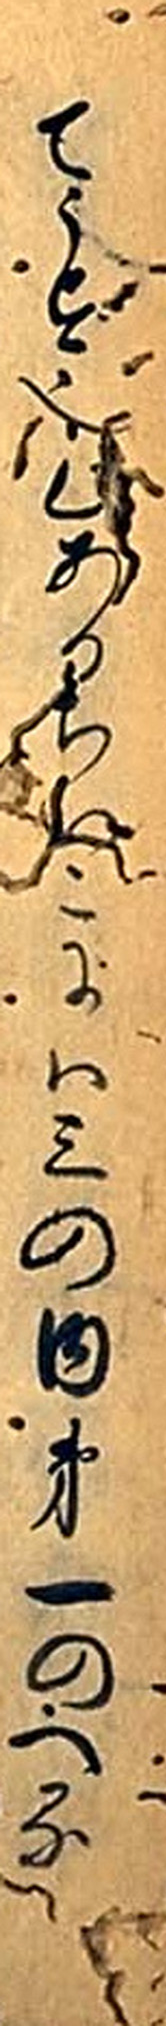てうす也此あるちいこには三の内第一のへる
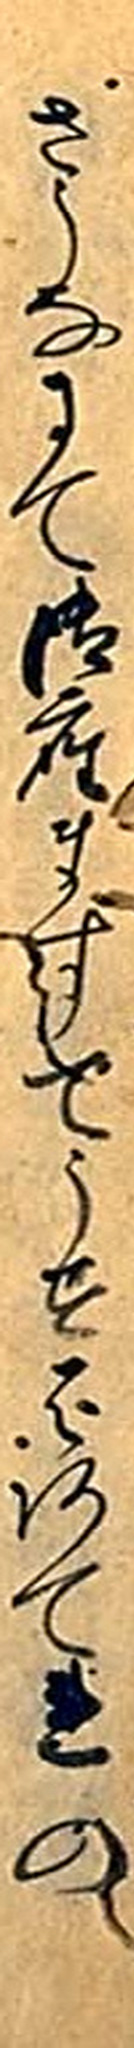さうなにて御座ますてうすはあてれの
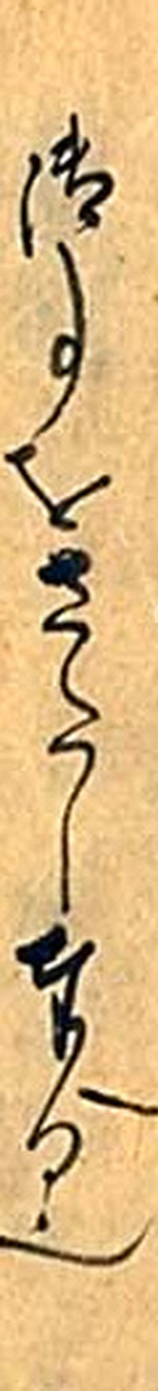御事をさたし奉る也
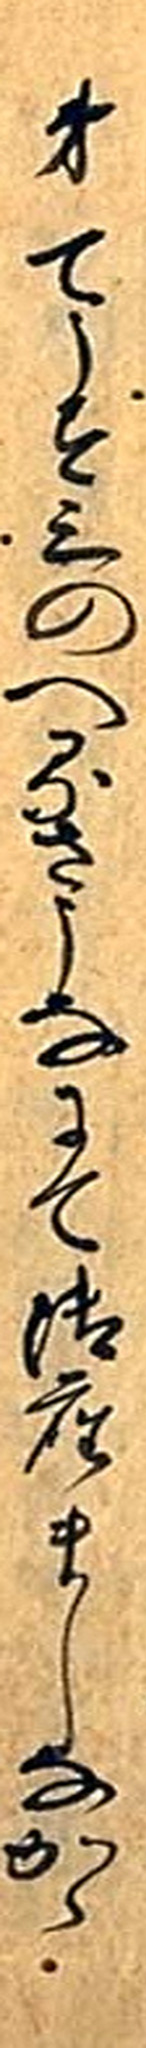弟てうす三のへるさうなにて御座ましなから
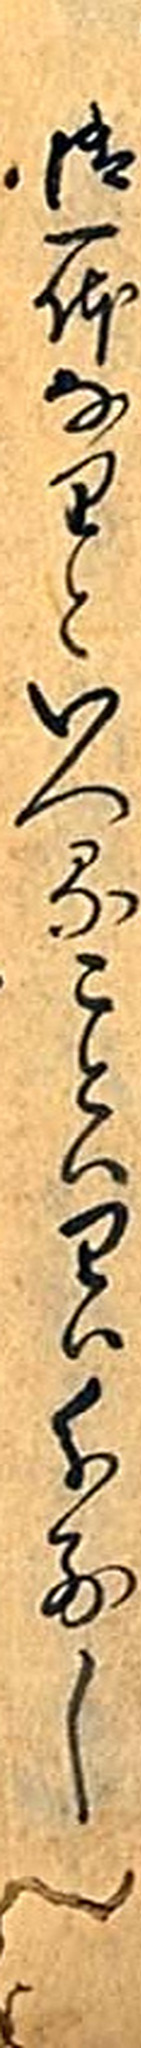御一体なりといへることはりは分別し
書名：ドチリナ・キリシタン
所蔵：東京大学総合図書館 / General Library in the University of Tokyo
